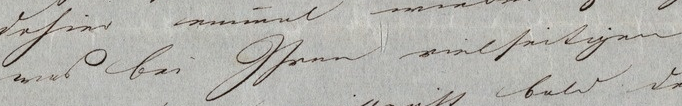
was bei Ihren vielseitigen
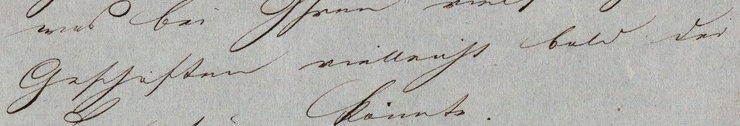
Geschäften vielleicht bald der
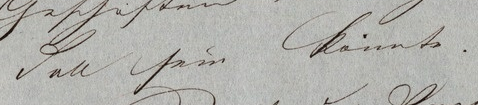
Fall sein könnte.
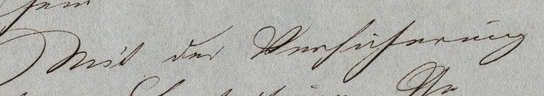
Mit der Versicherung
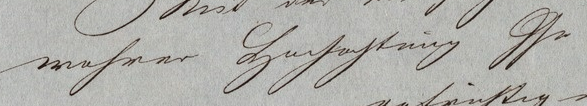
wahrer Hochachtung Ihr
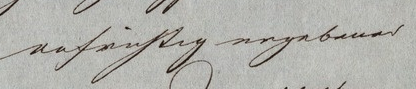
aufrichtig ergebener
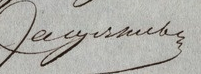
Jaegerhuber
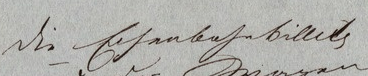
Die Eisenbahnbillets
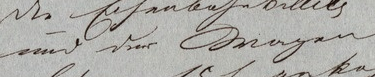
und der Wagen
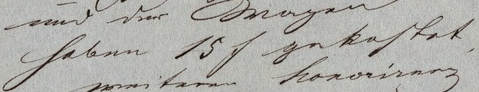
haben 15 f gekostet,
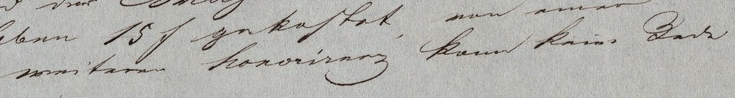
weiteren honorirung kann keine Rede
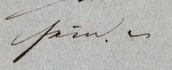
sein. –
